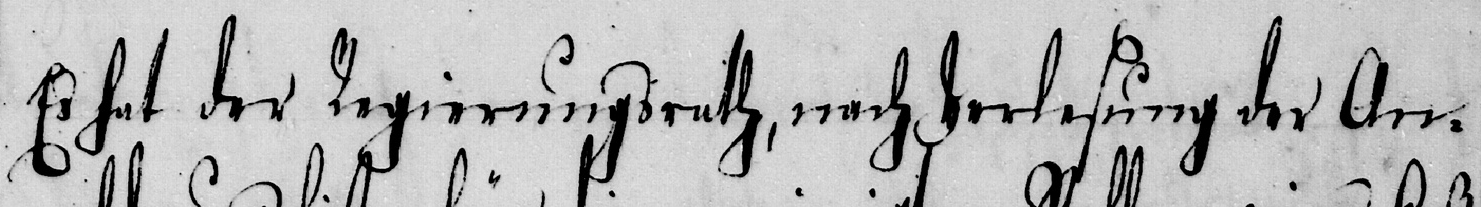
Es hat der Regierungsrath, nach Verlesung der An¬
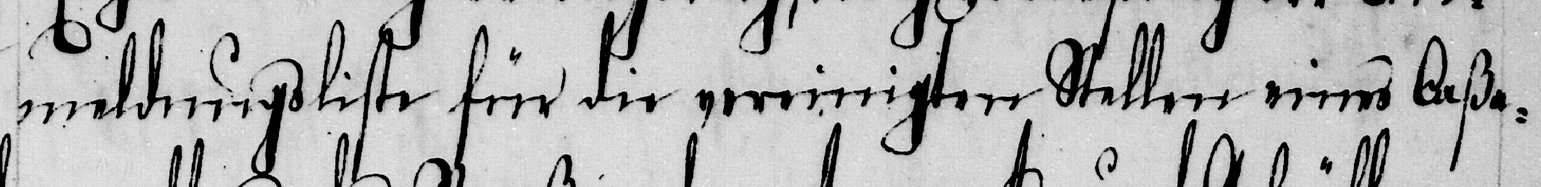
meldungsliste für die vereinigten Stellen eines Caßa¬
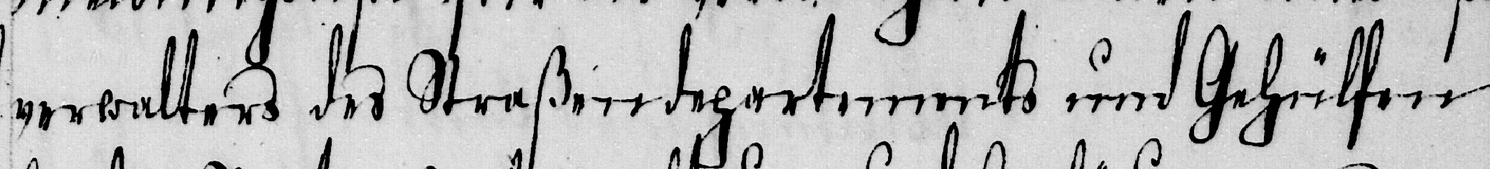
verwalters des Straßendepartements und Gehülfen
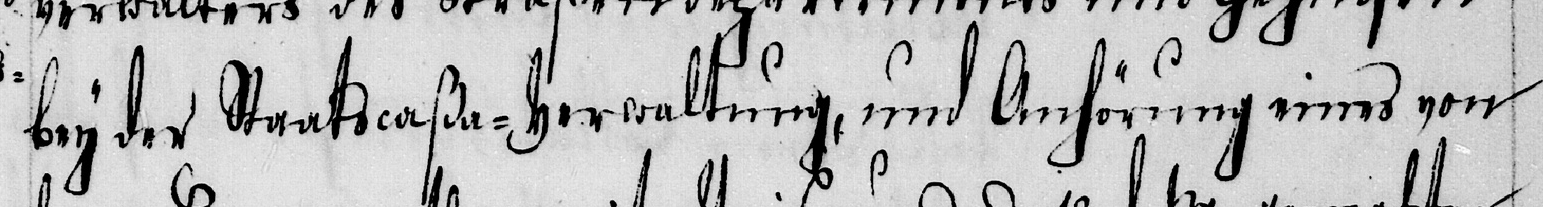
bey der Staatscaßa-Verwaltung, und Anhörung eines von
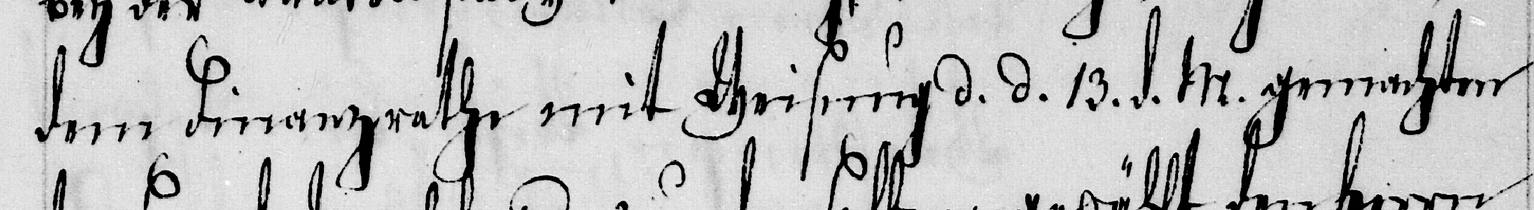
dem Finanzrathe mit Weisung d. d. 13. d. M. gemachten
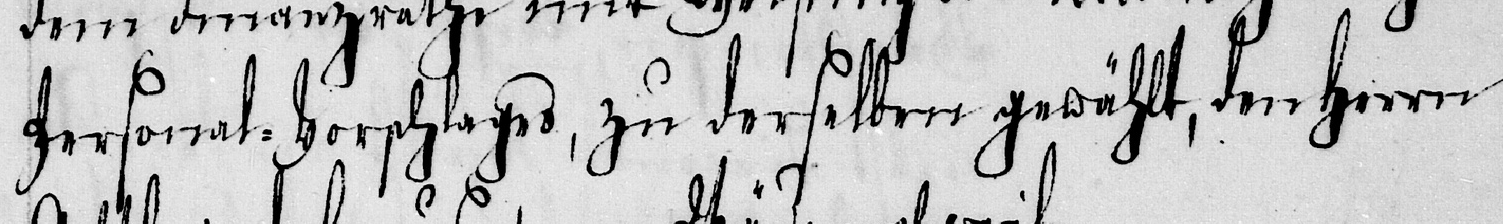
Personal-Vorschlags, zu derselben gewählt, den Herrn
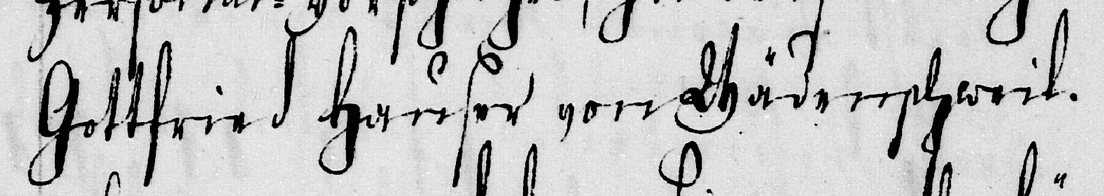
Gottfried Hauser von Wädenschweil.
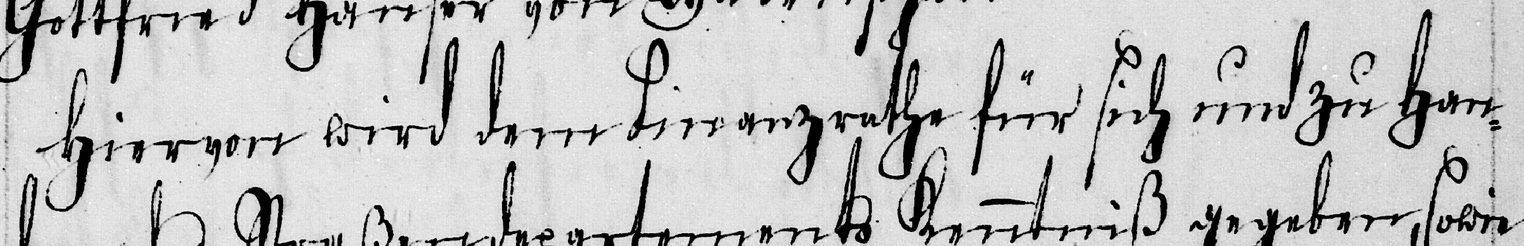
Hiervon wird dem Finanzrathe für sich und zu Han¬
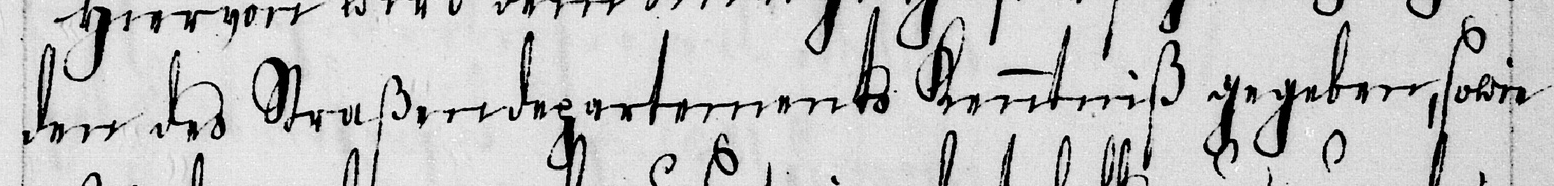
den des Straßendepartements Kenntniß gegeben, sowie
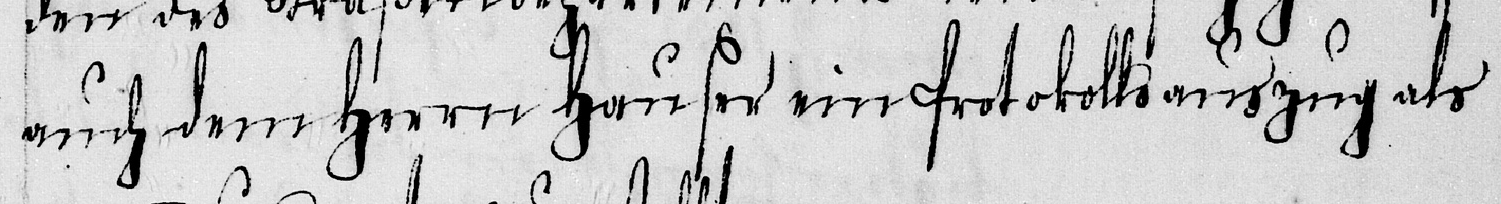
auch dem Herrn Hauser ein Protokollsauszug als
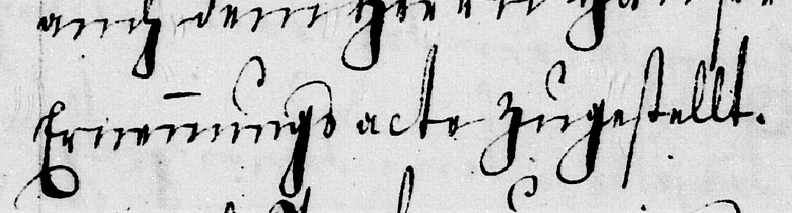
Ernennungsacte zugestellt.
